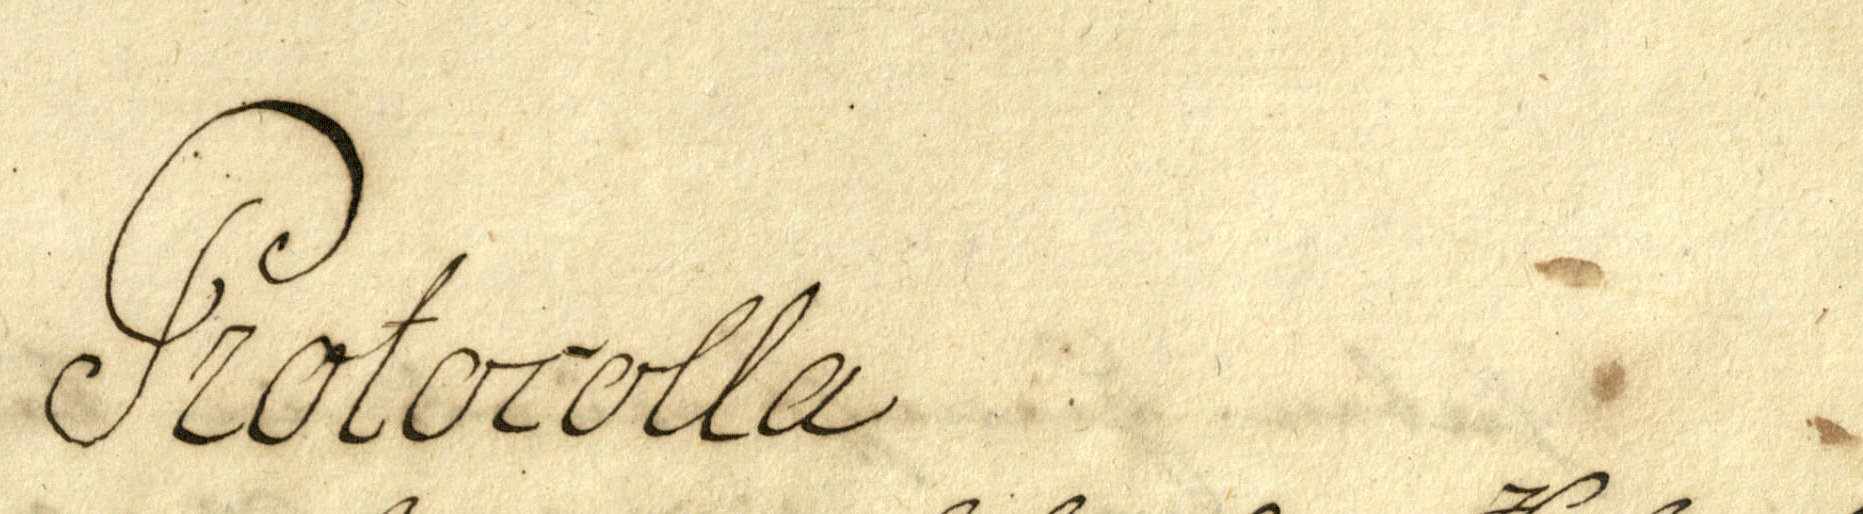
Protocolla
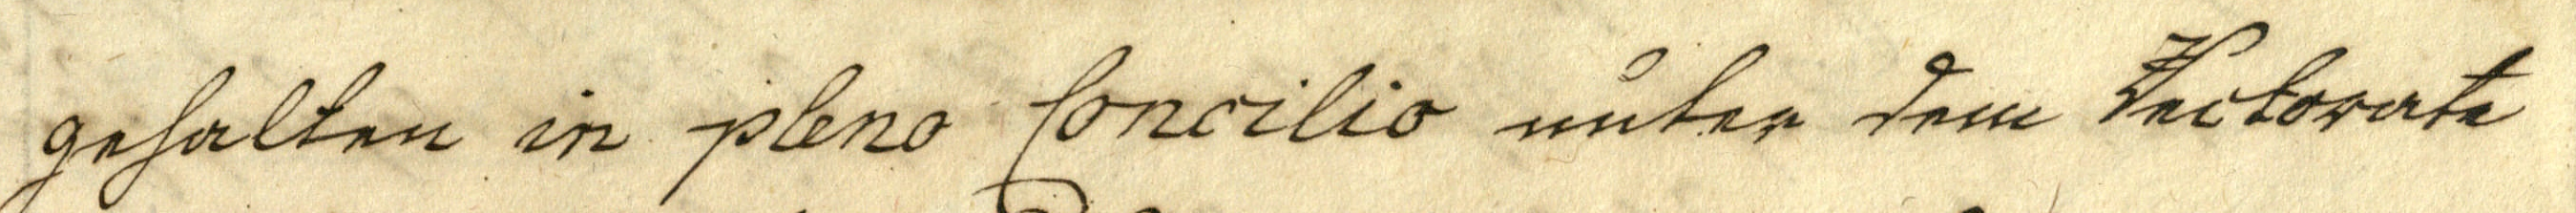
gehalten in pleno Concilio unter dem Rectorate
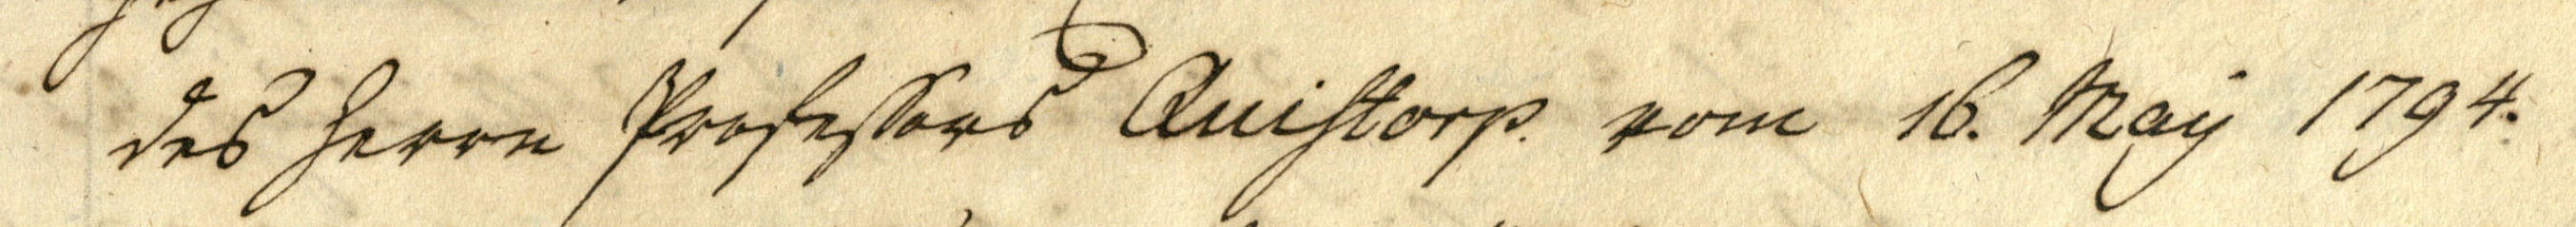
des herrn Professors Quistorp vom 16. May 1794
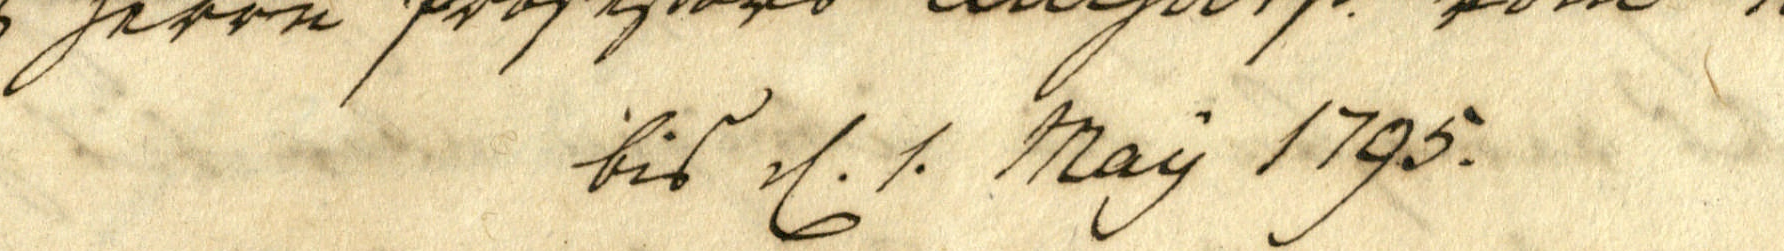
bis d. 1. May 1795
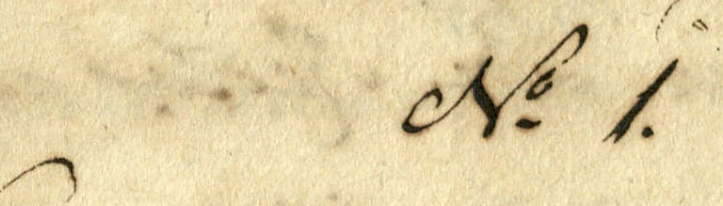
No 1.
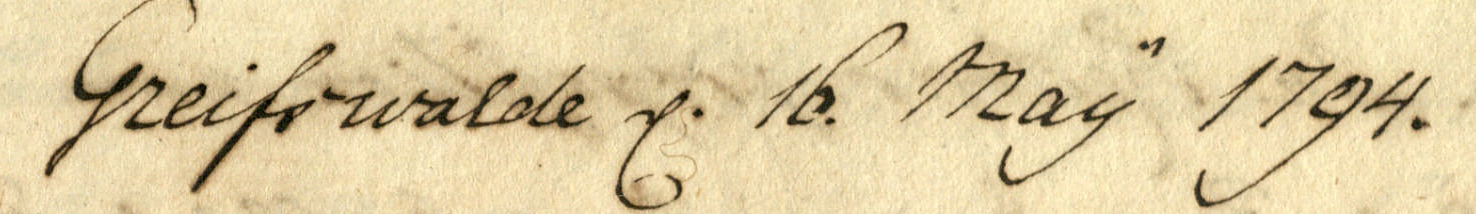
Greifswalde d. 16. May 1794
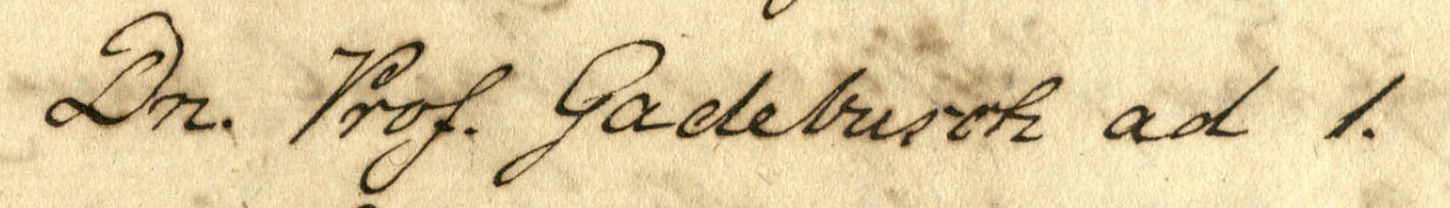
Dn. Prof. Gadebusch ad 1.
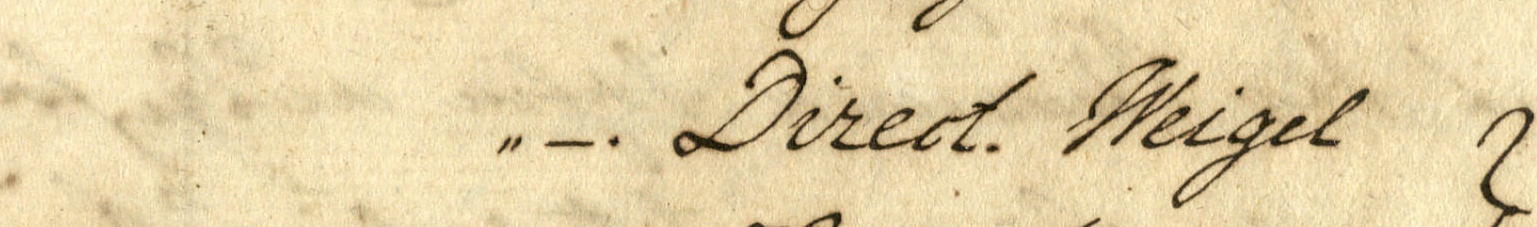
"-" Direct. Weigel
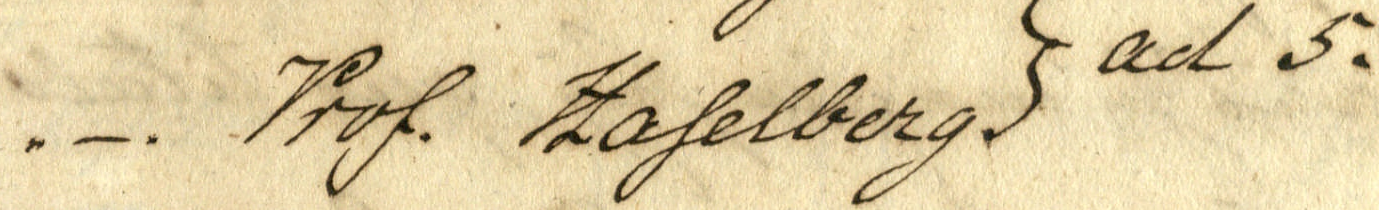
"-" Prof. Haselberg ad 5.
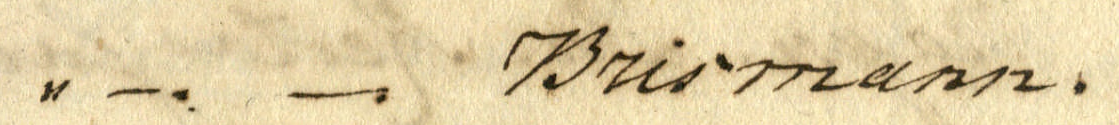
"-"- Brismann.
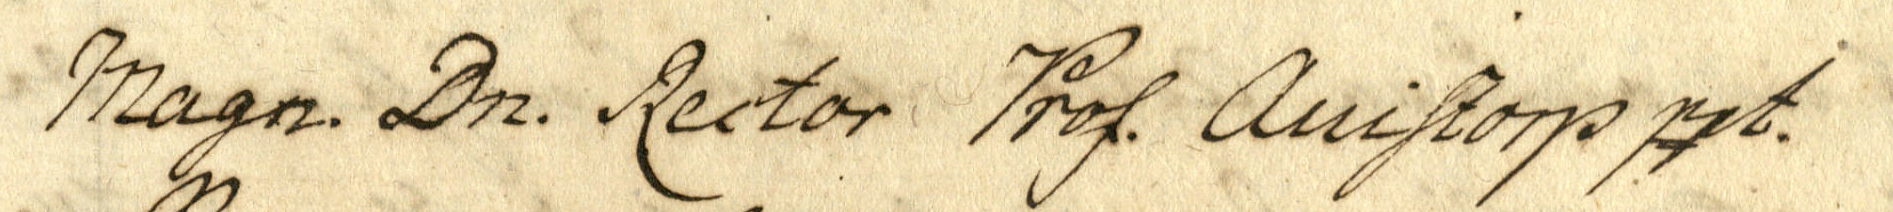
Magn. Dn. Rector Prof. Quistorp ppt.
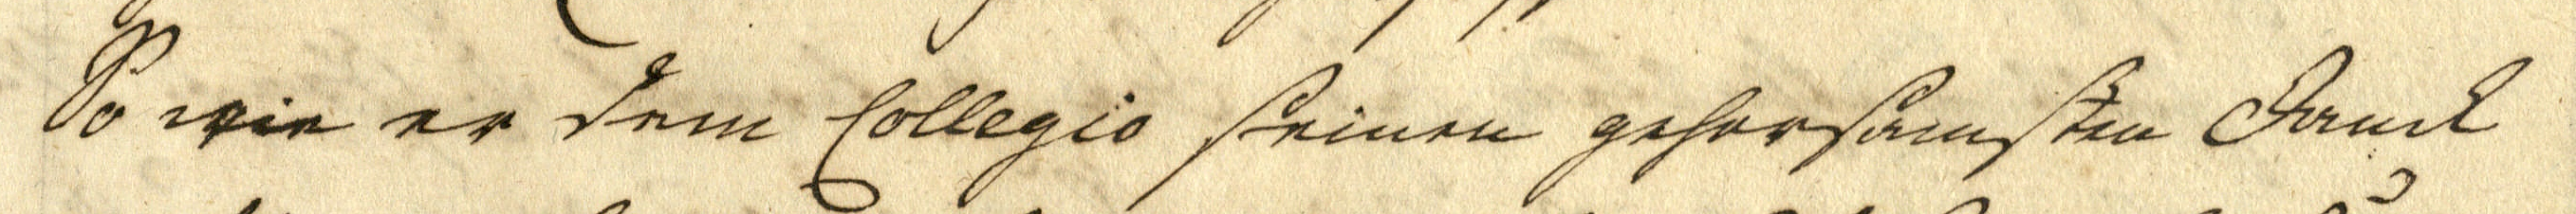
So wie er dem Collegio seinen gehorsamsten Dank
